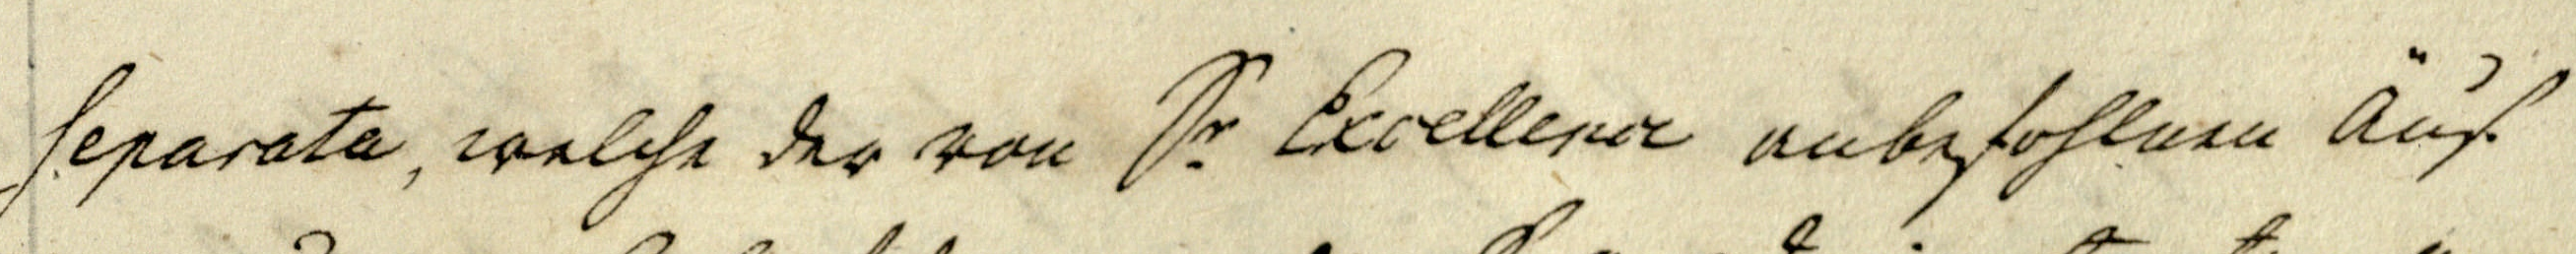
separata, welche der von Sr Excellence anbefohlnen Äus¬
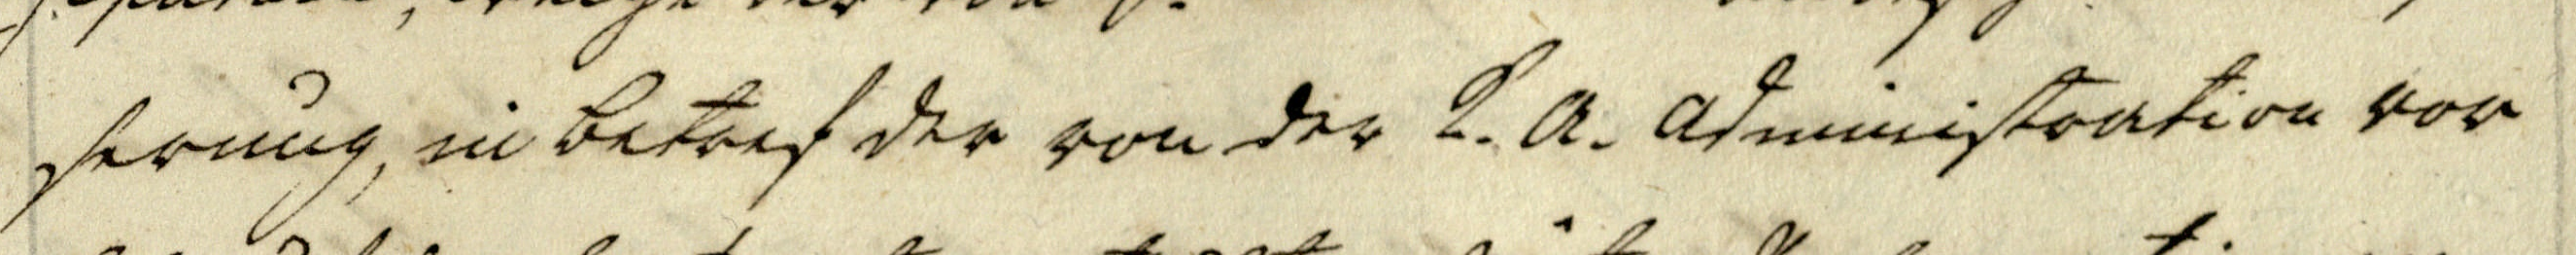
serung, in Betref der von der K. A. Administration vor
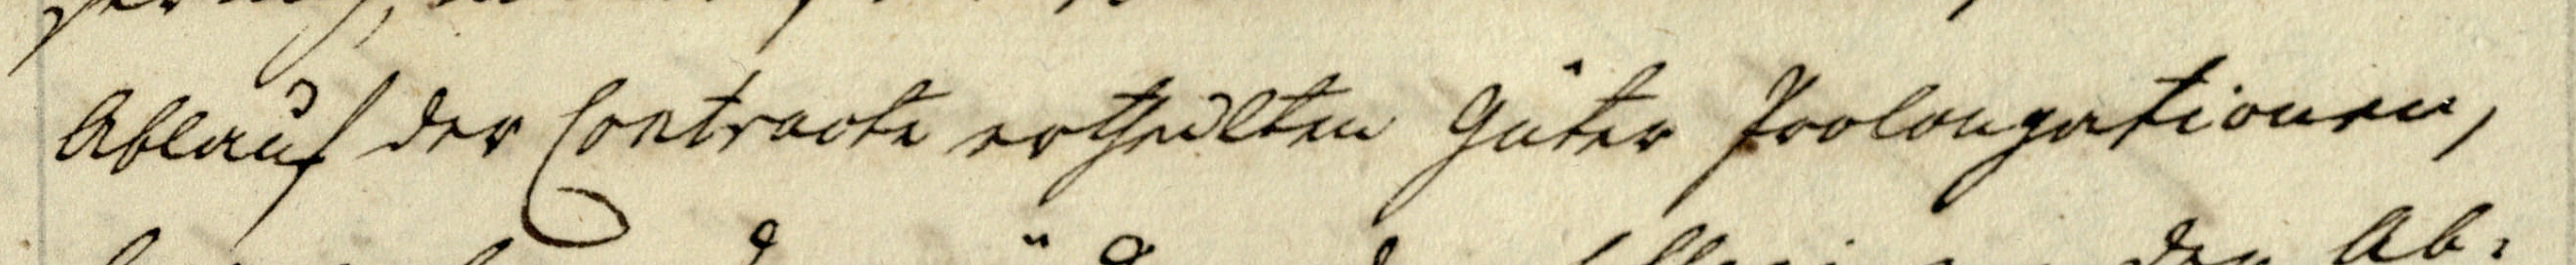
Ablauf der Contracte ertheilten Güter Prolongationen,
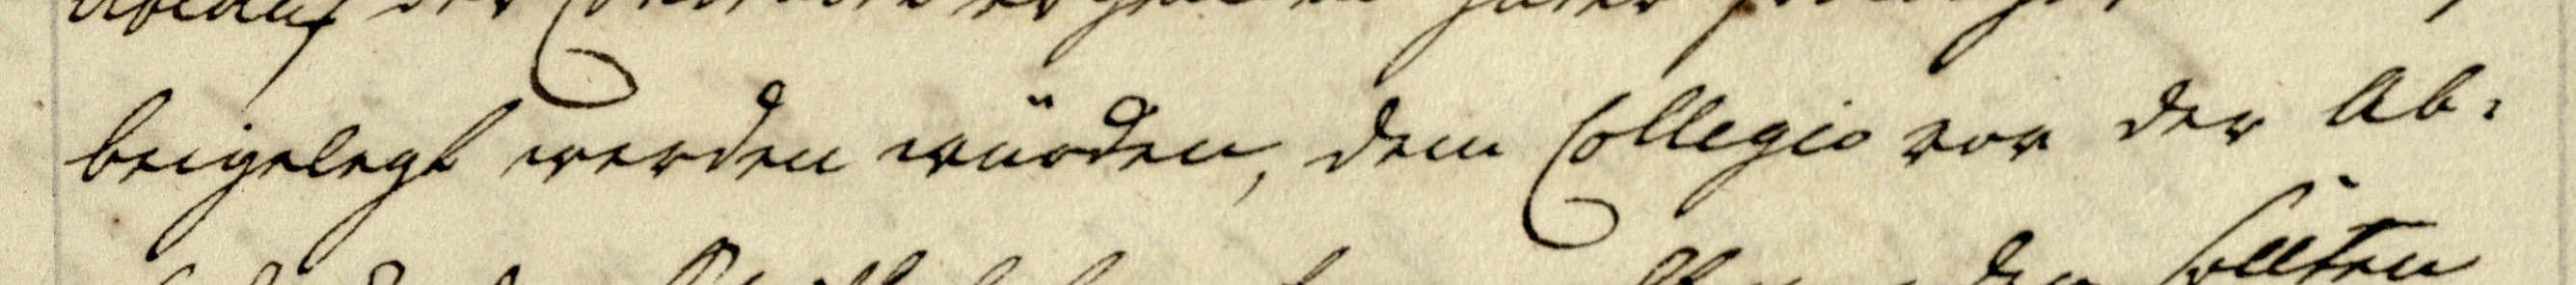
beigelegt werden würden, dem Collegio vor der Ab¬
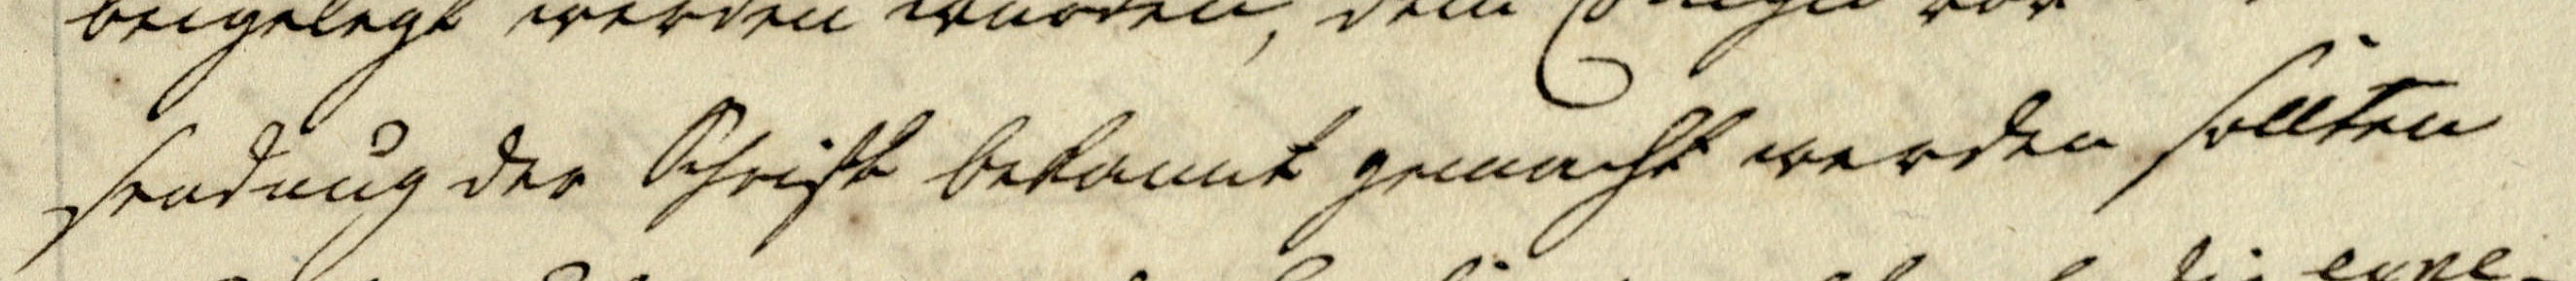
sendung der Schrift bekannt gemacht werden sollten
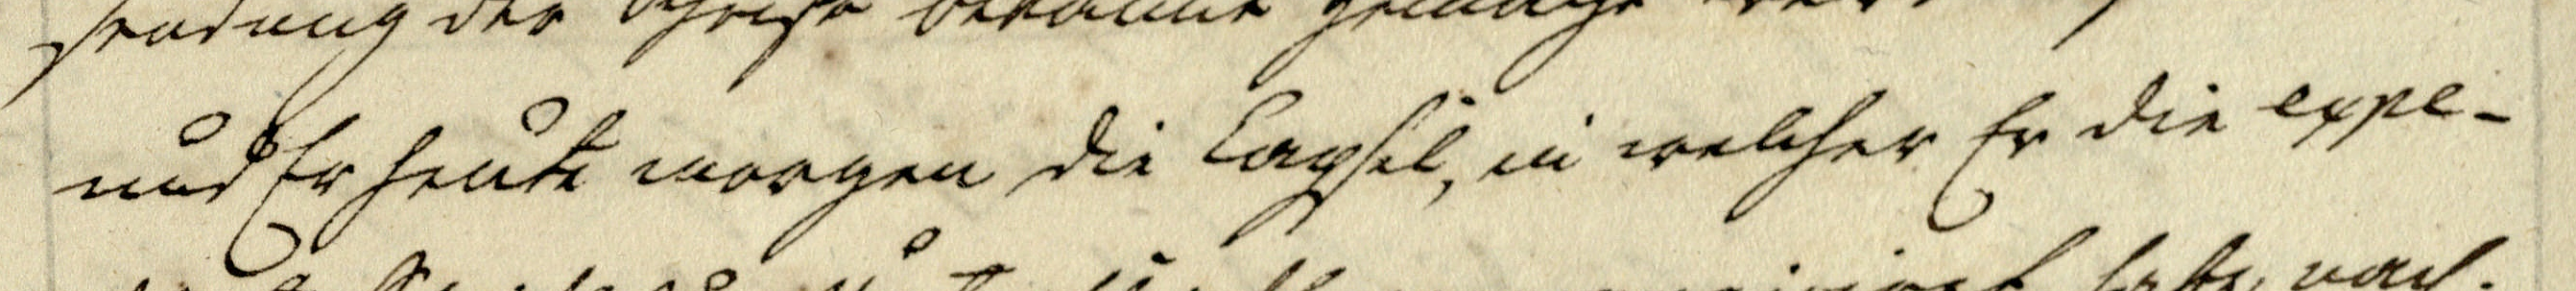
und Er heute morgen die Capsel, in welcher Er die expe¬
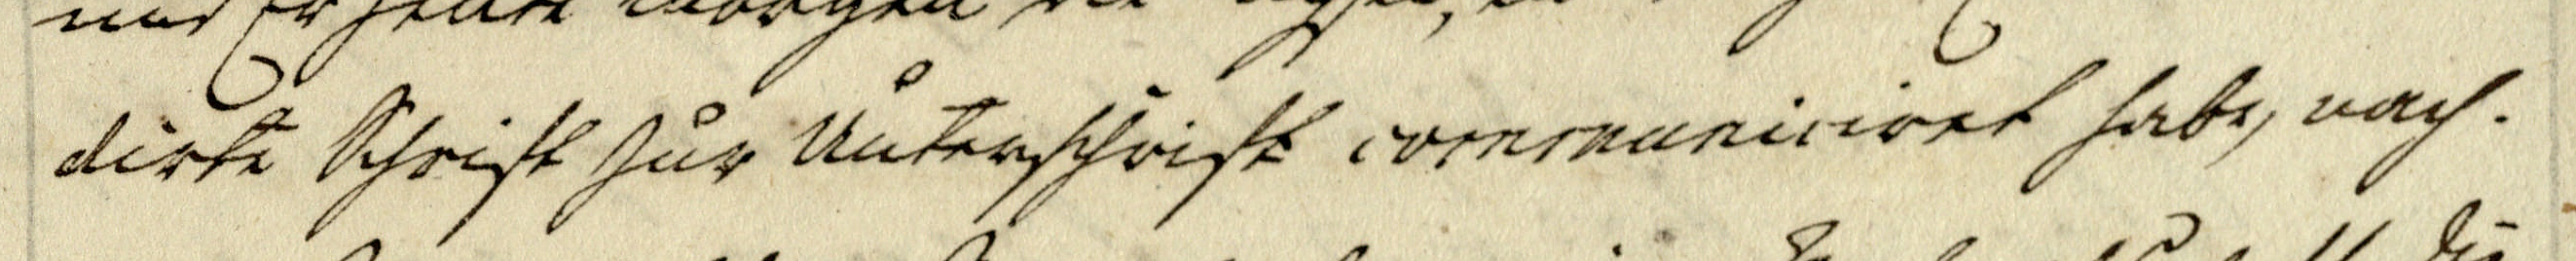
dirte Schrift zur Unterschrift communiciret habe, nach¬
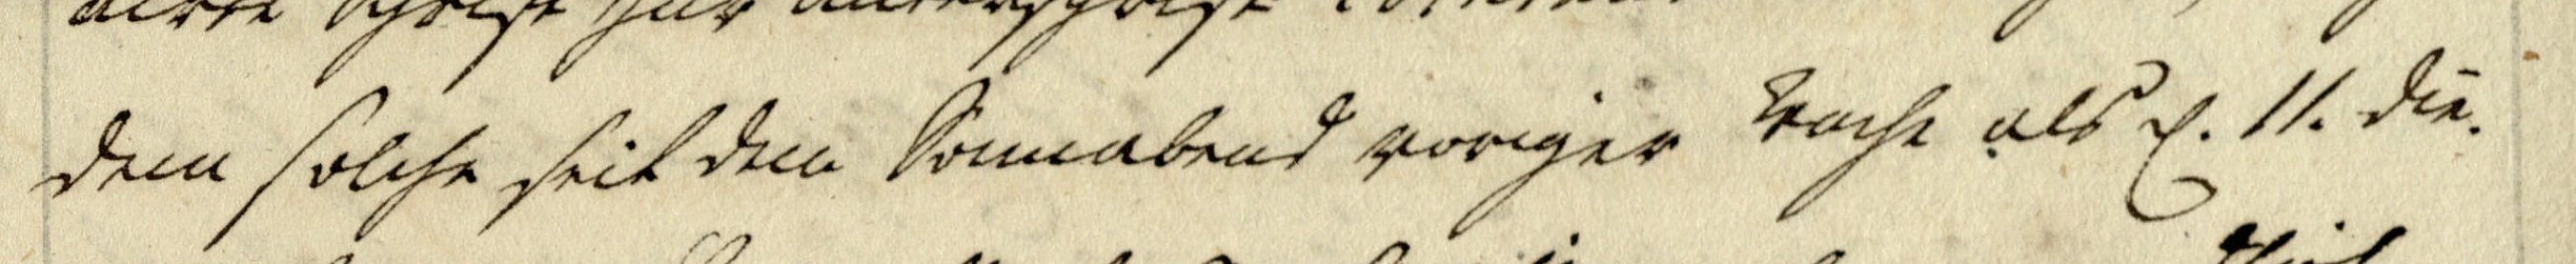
dem solche seit dem Sonnabend voriger Woche als d. 11. die¬
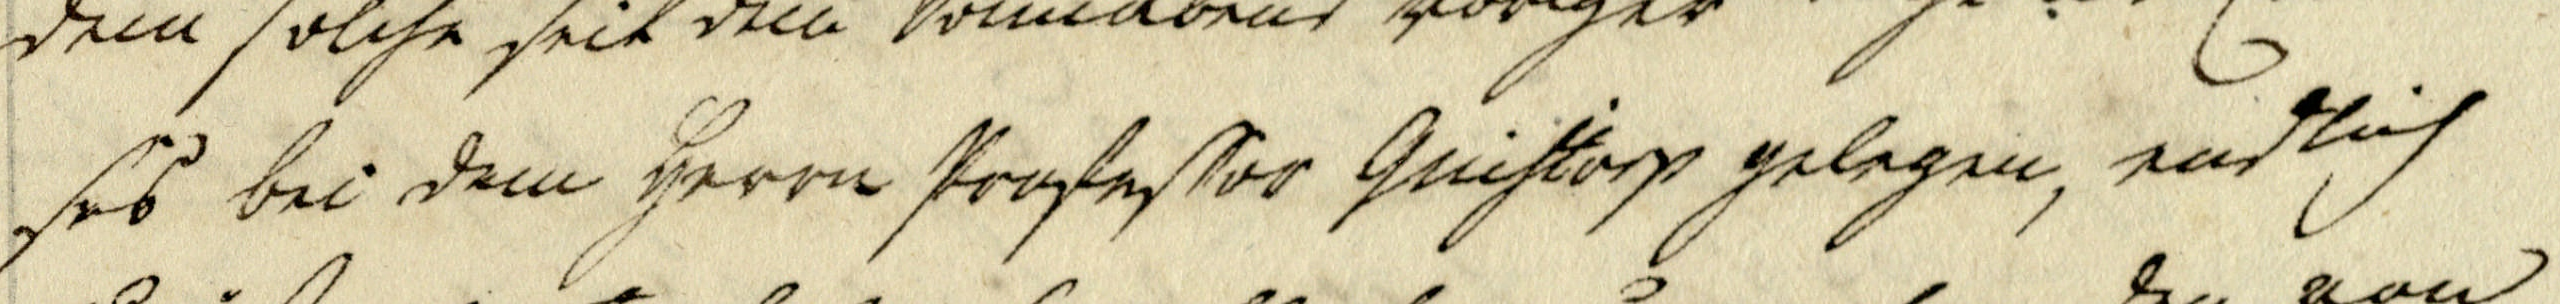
ses bei dem Herrn Professor Quistorp gelegen, endlich
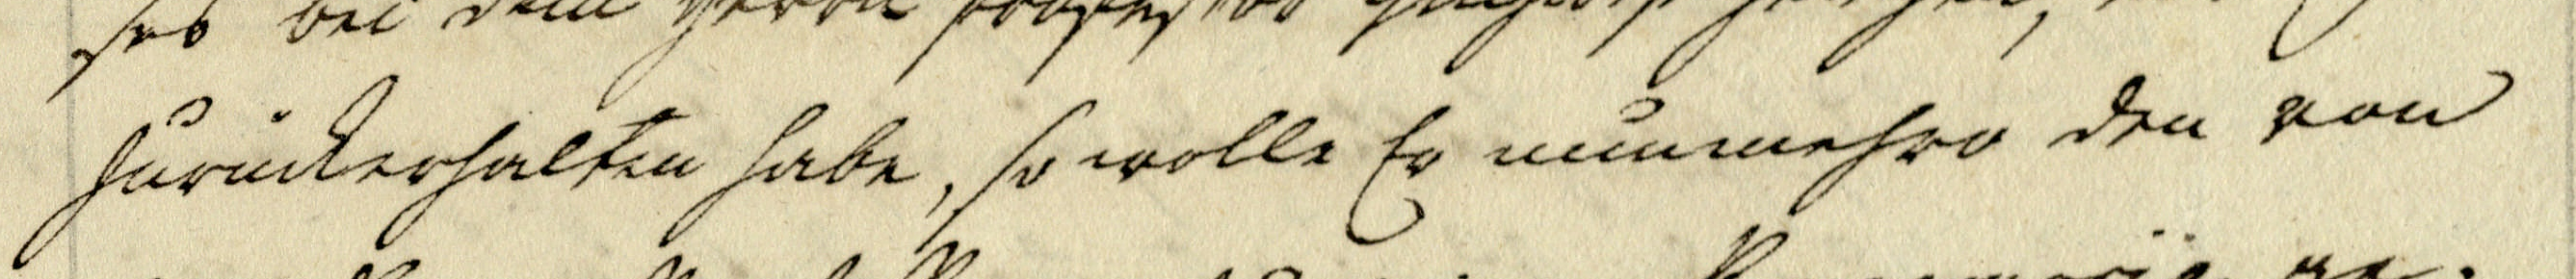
zurückerhalten habe, so wolle Er nunmehro den von
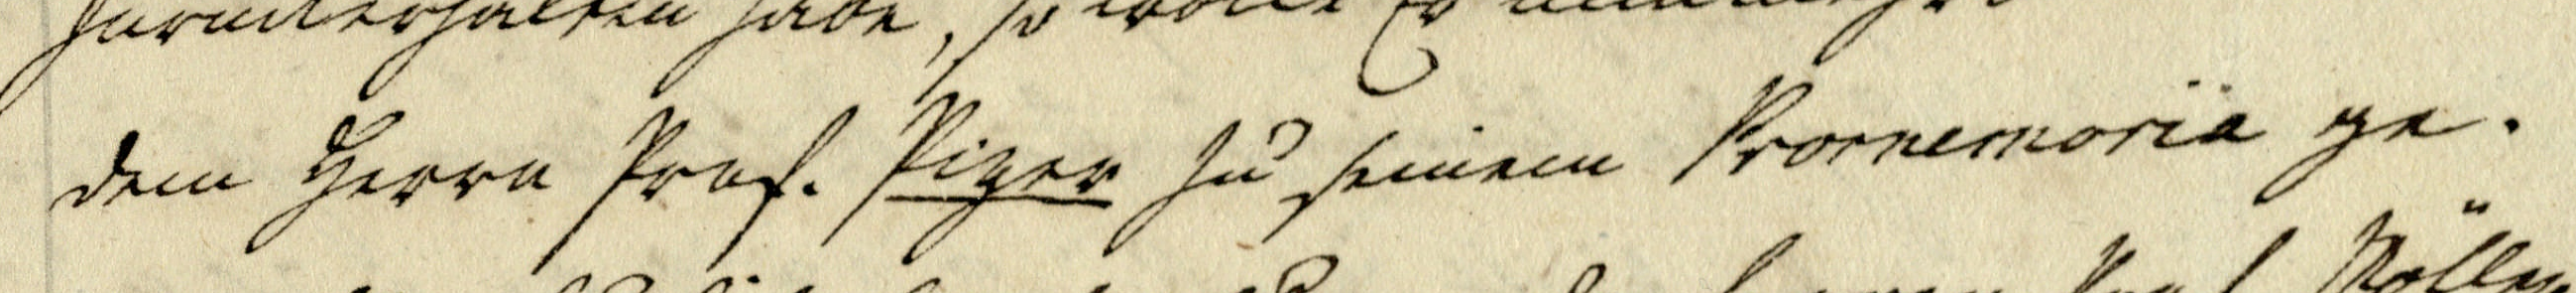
dem Herrn Prof. Piper zu seinem Promemoria ge¬
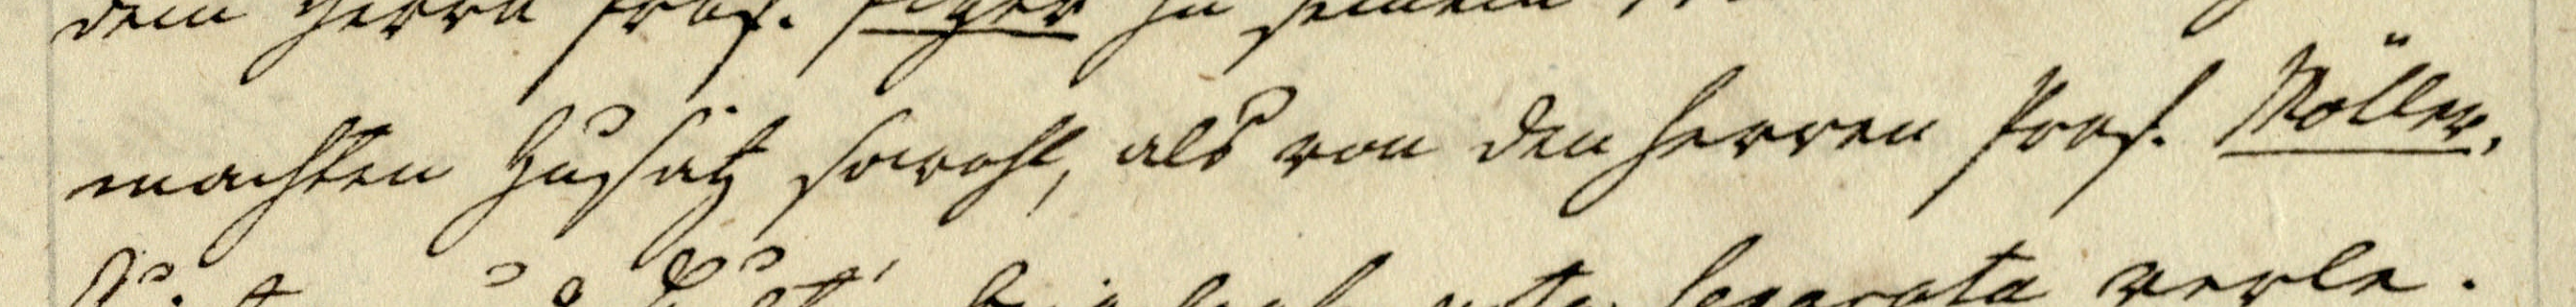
machten Zusatz sowohl, als von den Herren Prof. Möller,
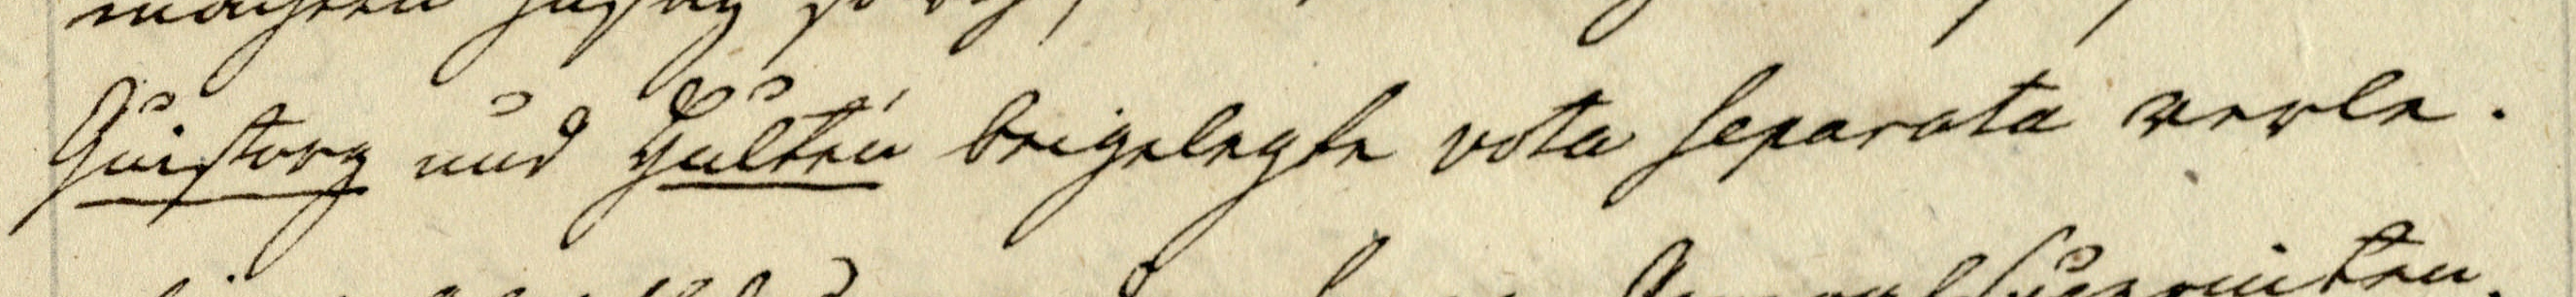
Quistorp und Hultén beigelegte vota separata verle¬
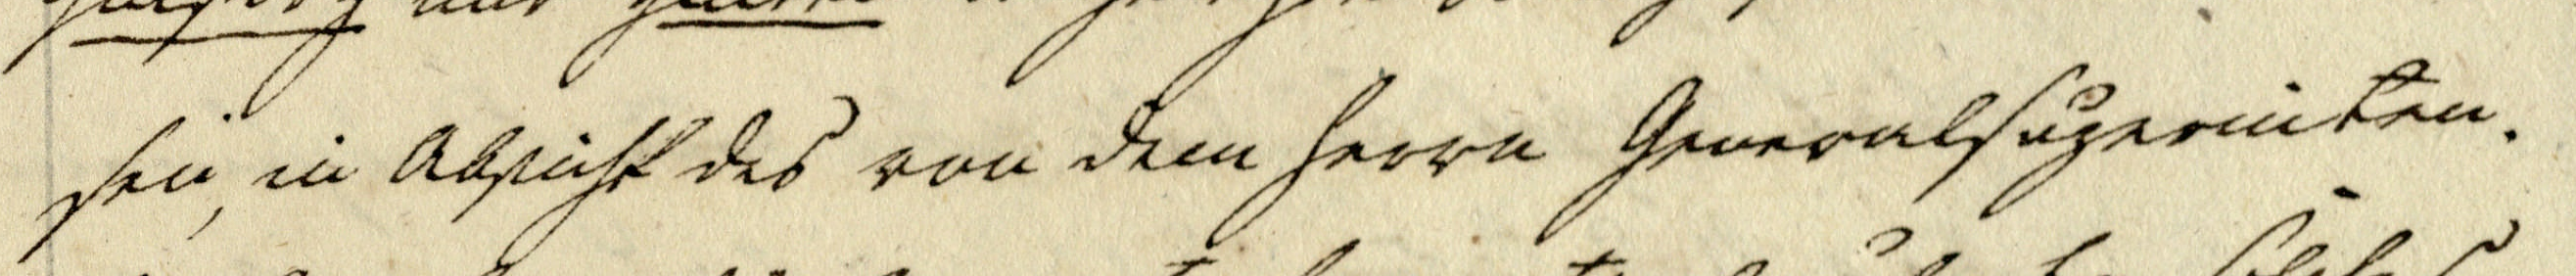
sen, in Absicht des von dem Herrn Generalsuperinten¬
